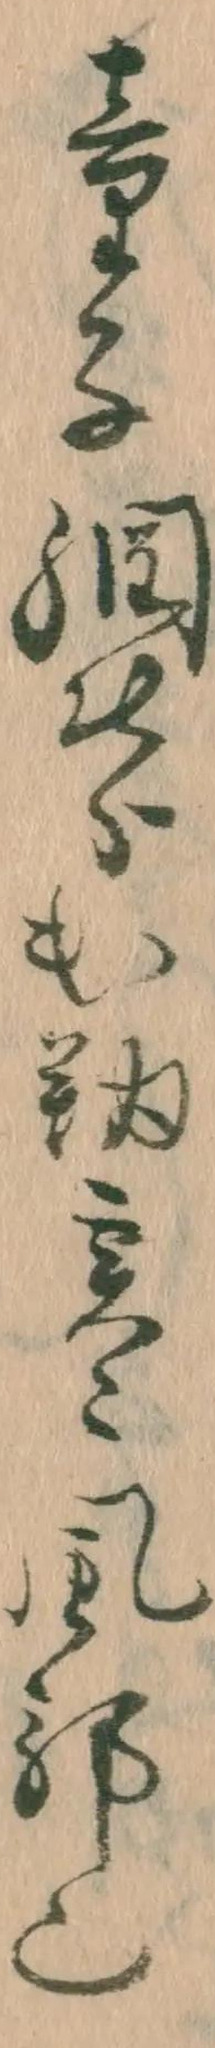童子綱次郎出勤実々風邪也
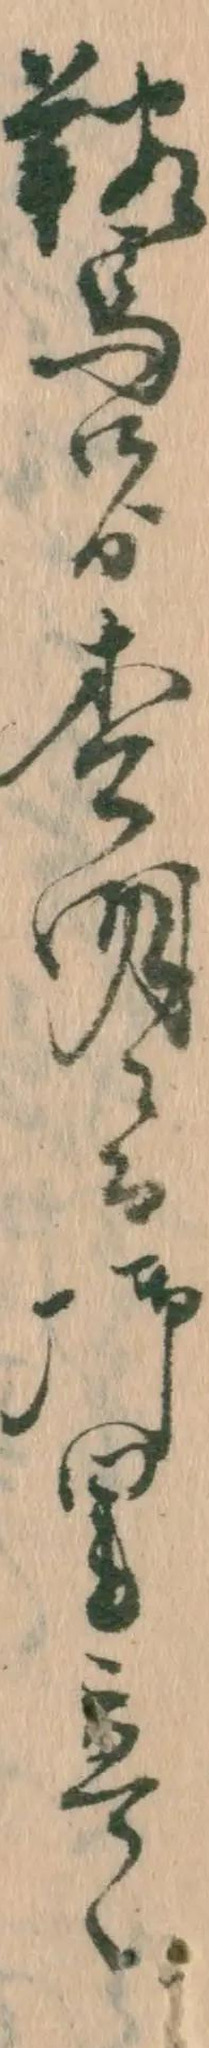鞍馬口ゟ松明ニて御里亭へ
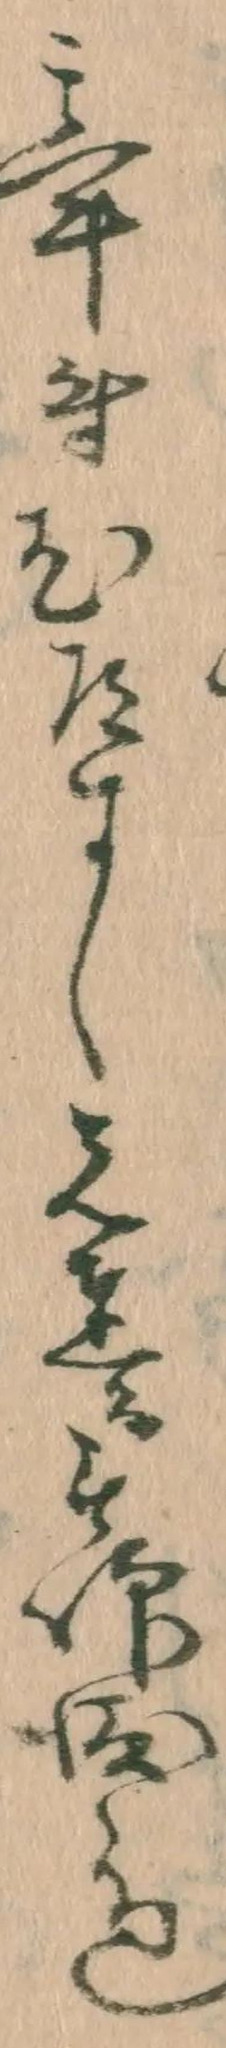牽付尤道すし先達而被仰渡候通
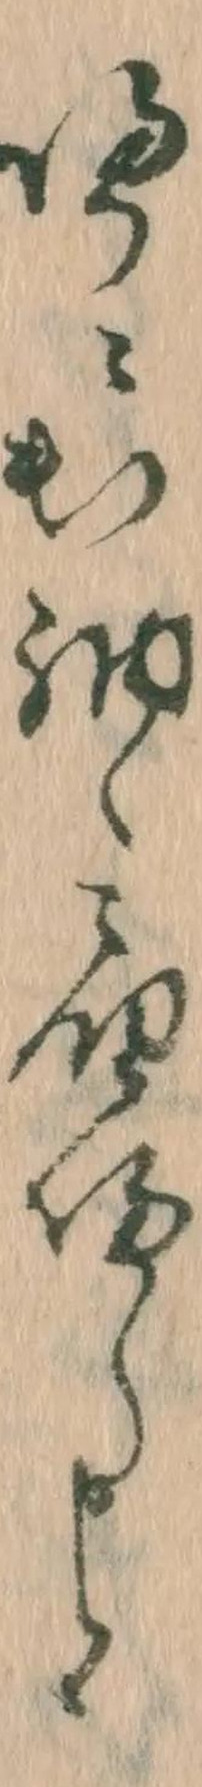帰ニ出納へ届帰り申候
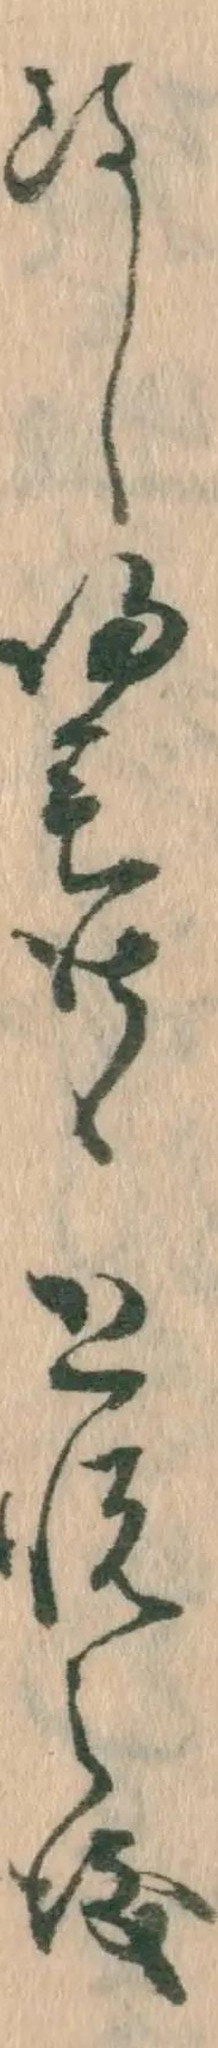致し帰宅仕候恐悦之儀
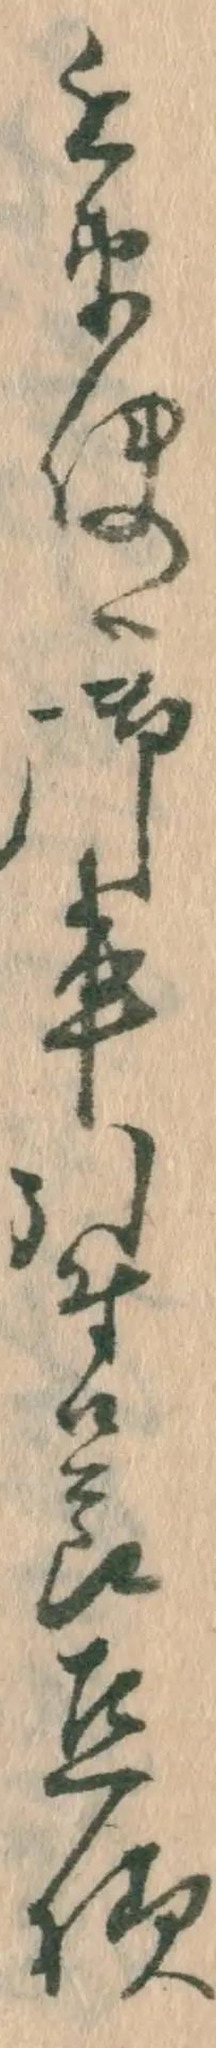近衛使ハ御車引付候節直様
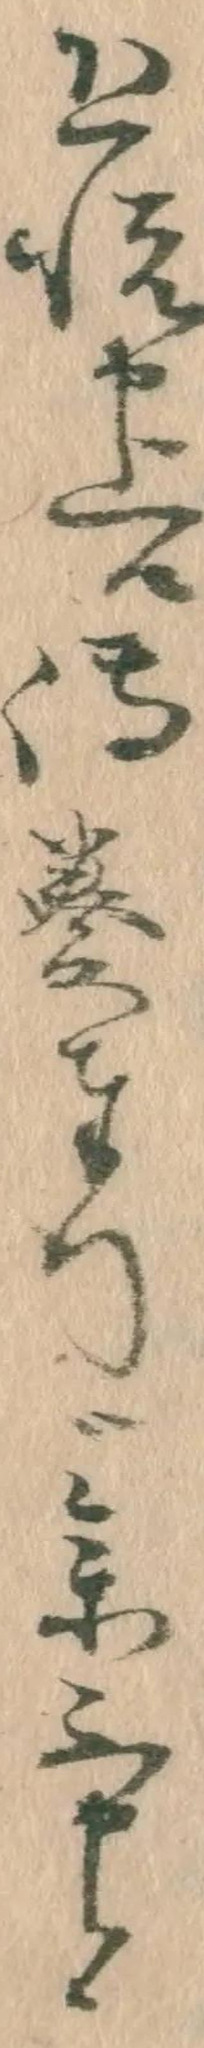恐悦申上候伝奏奉行ハ参不申候
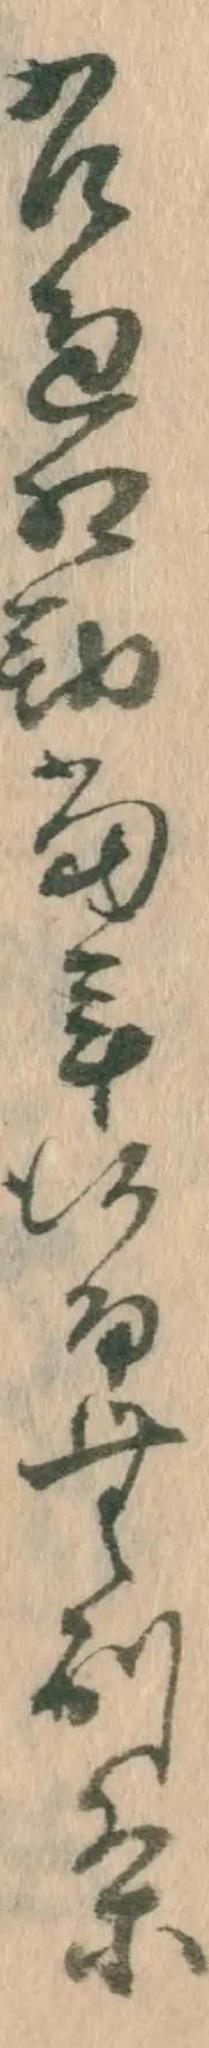右通相勤当年何角無別条

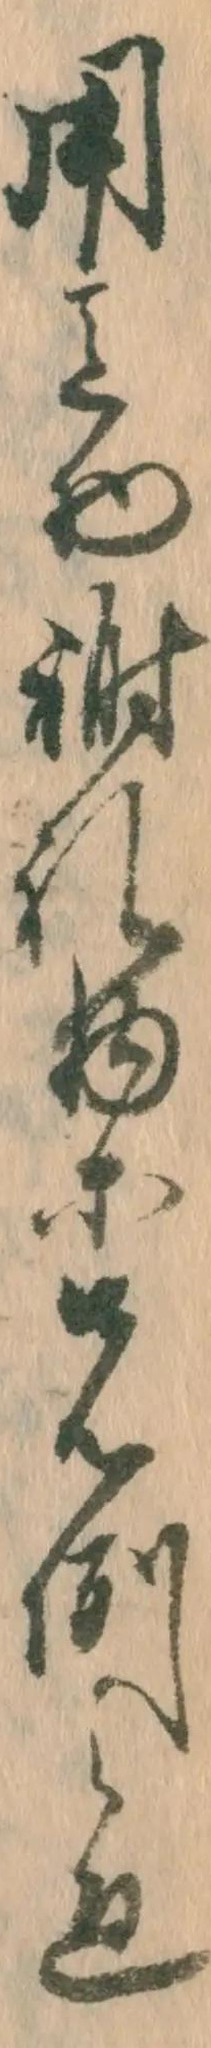用意物謝礼物等先例之通
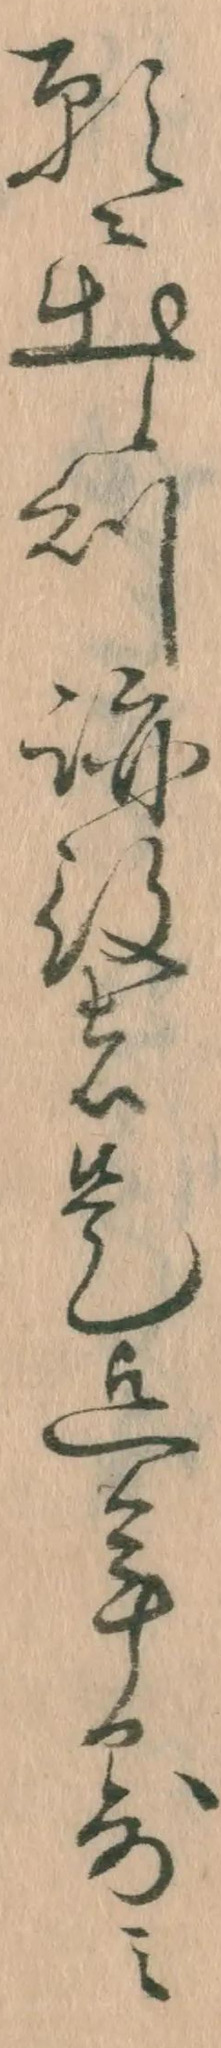願ニ出候則跡役者是迄年寄之
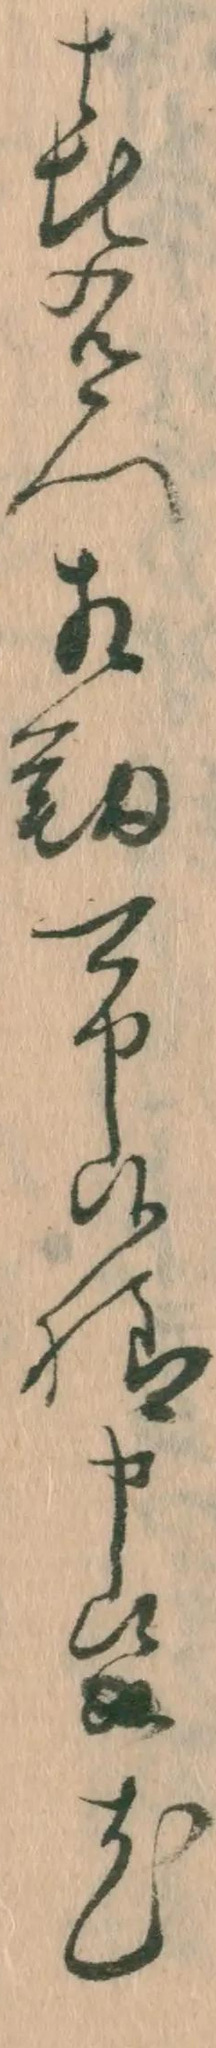喜右衛門相勤可申候様申候尤
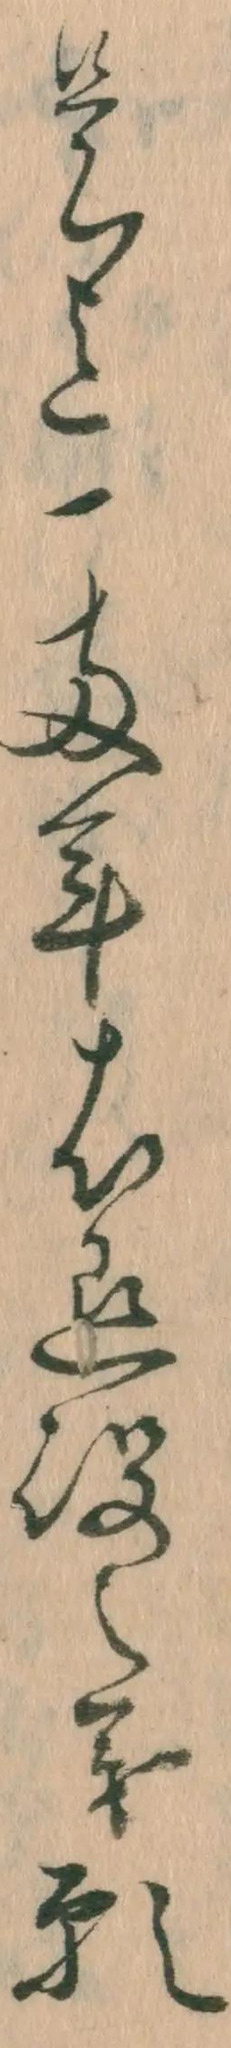是迄一両年右退役之義願
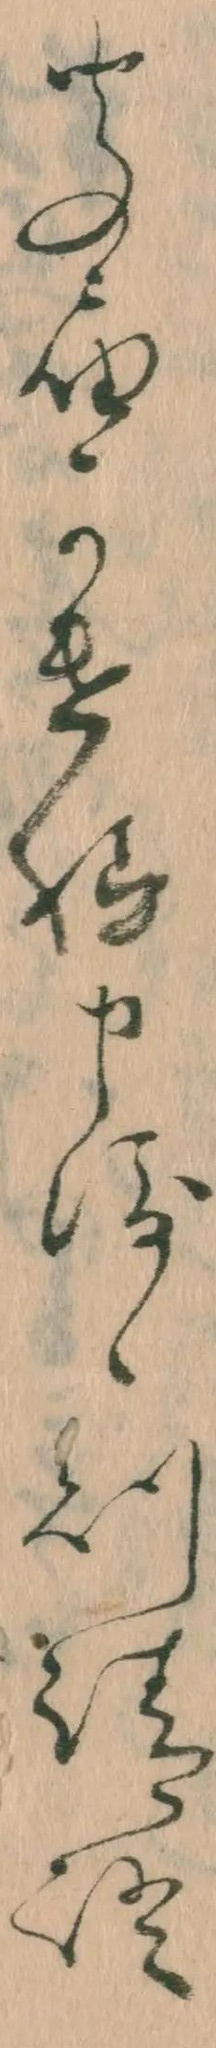聞届可遣様申渡候則請候證
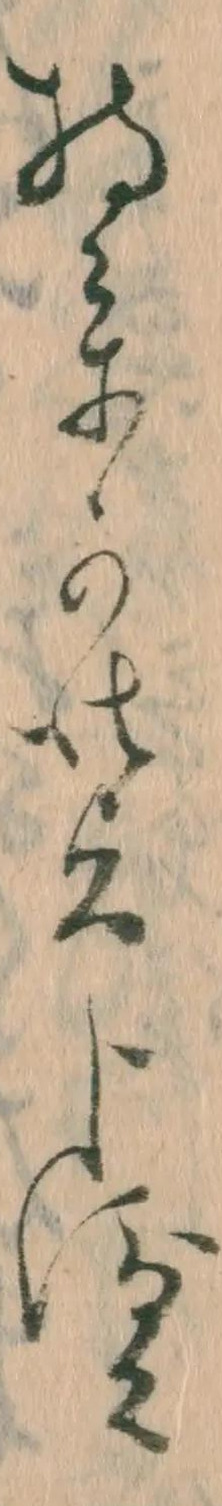持参可仕旨申渡候
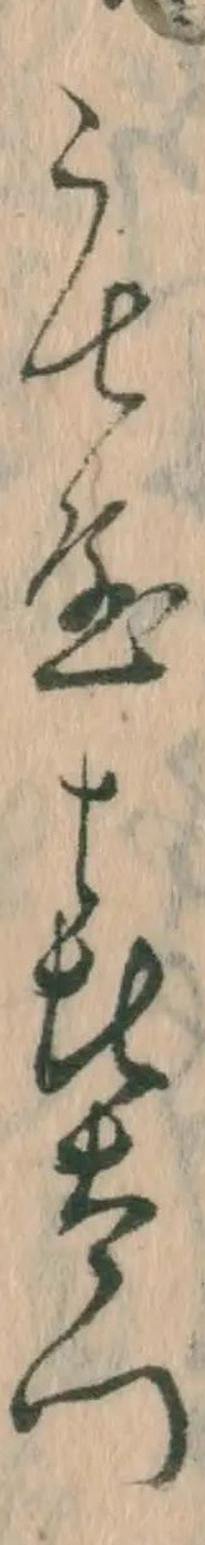庄屋喜右衛門
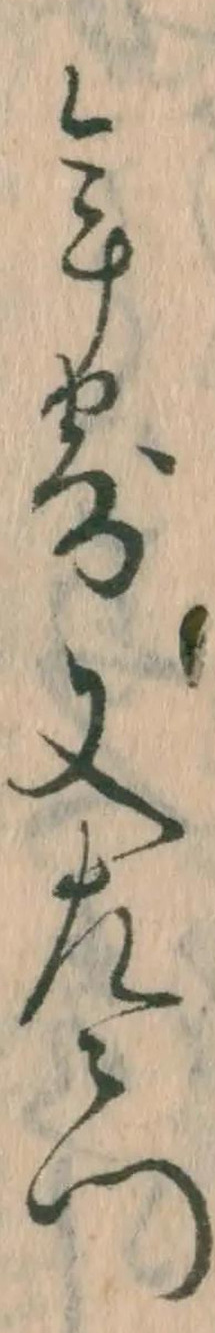年寄又左衛門
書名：賀茂社記録. 第61冊
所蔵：国立国会図書館 National Diet Library, JAPAN
